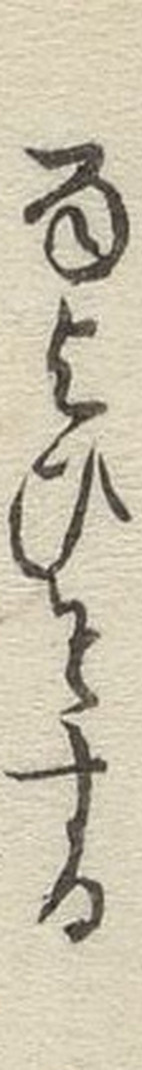雨乞ひをする
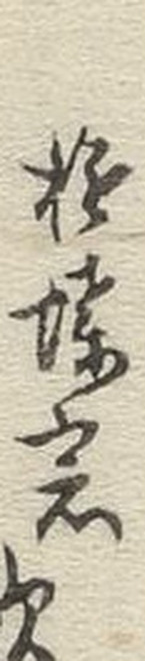遊蝶衆
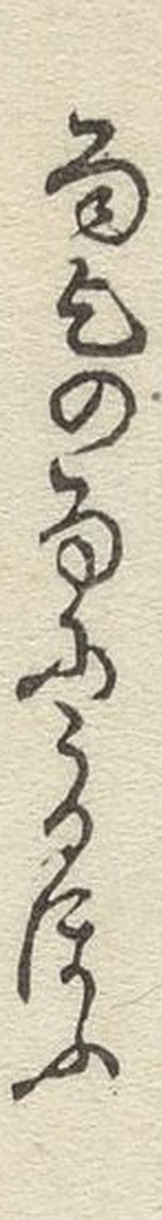雨乞の雨にうるほふ
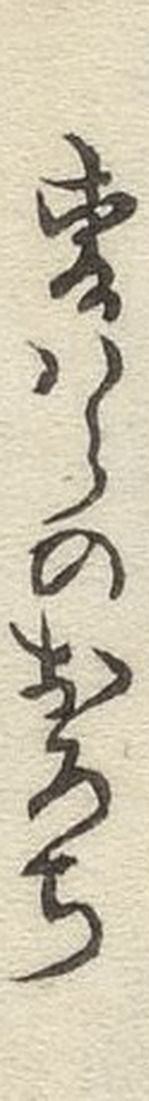麦はらのおろち
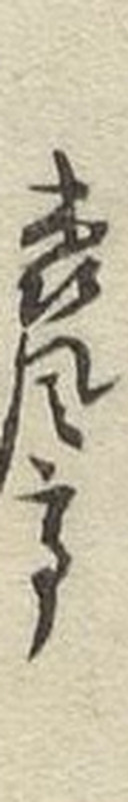森風亭
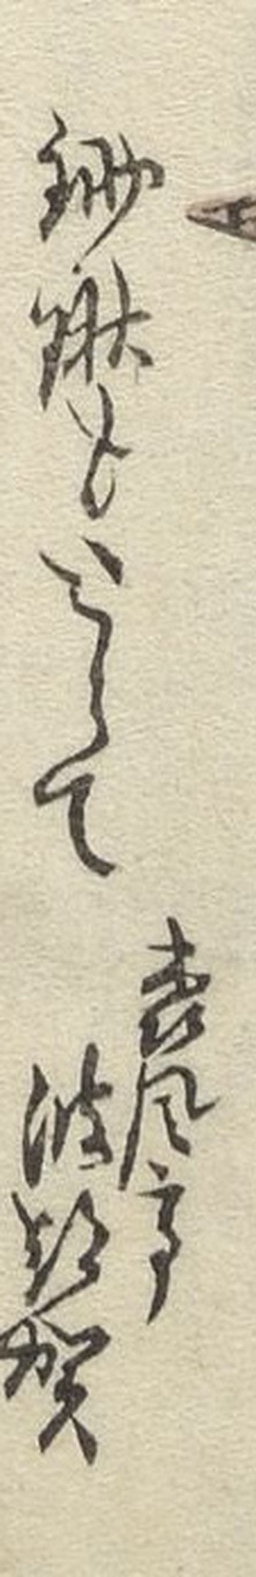鋤鍬もとらて波都賀
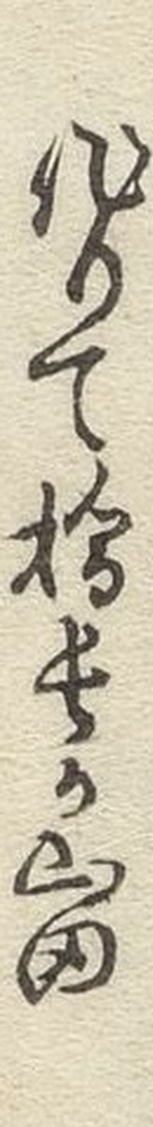つくりて稲長か山田
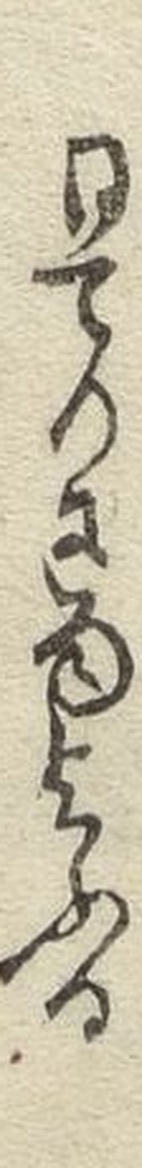日てりに雨よふる
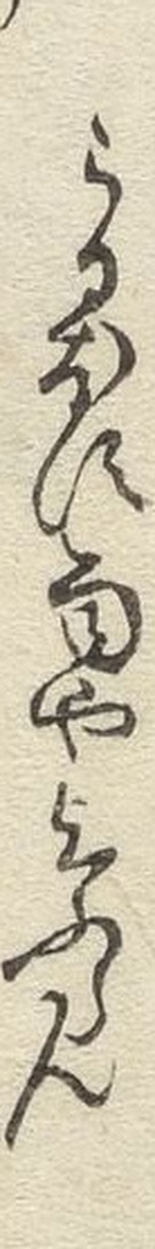うるほす雨やよふらん
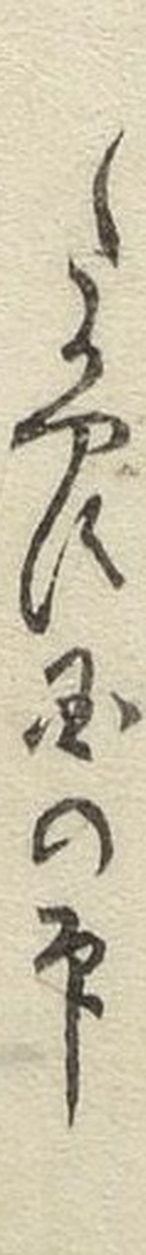たかやす国の印
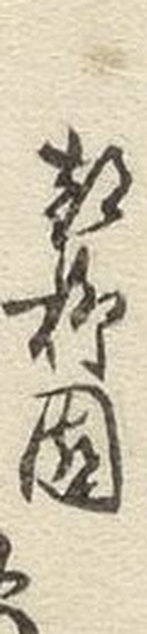都柳園
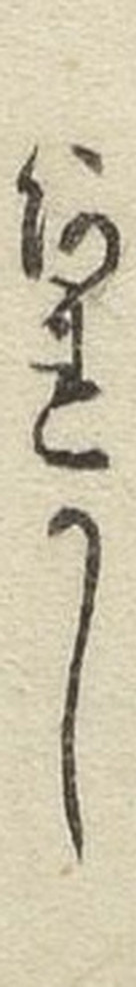あれかし
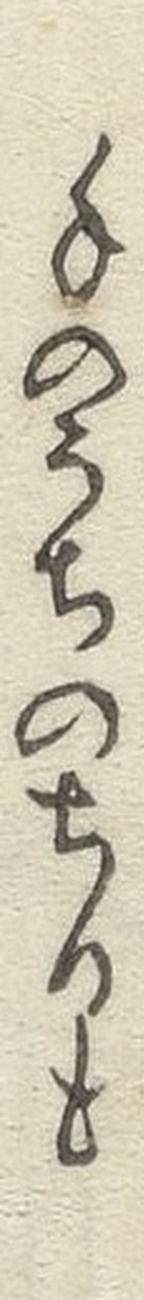手のうちのちりも
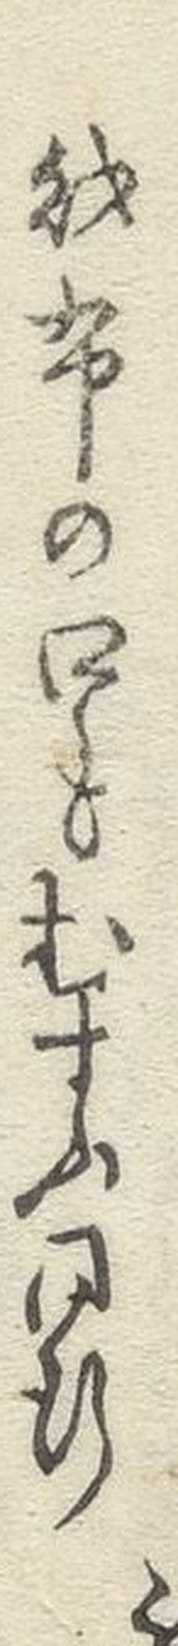財布の口もむすふ同行
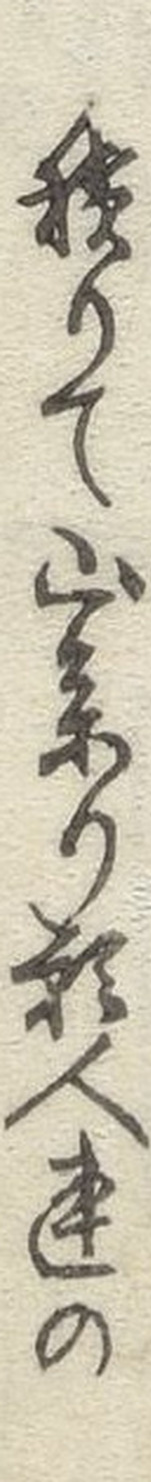積りて山参り願人連の
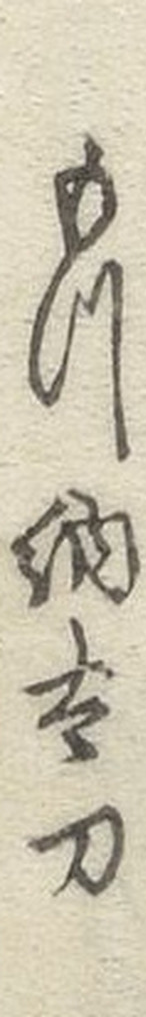もつ納太刀
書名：Picture Album of People with Kyōka (Light Verse) (Kyōka shiki jinbutsu 狂歌四季人物)
